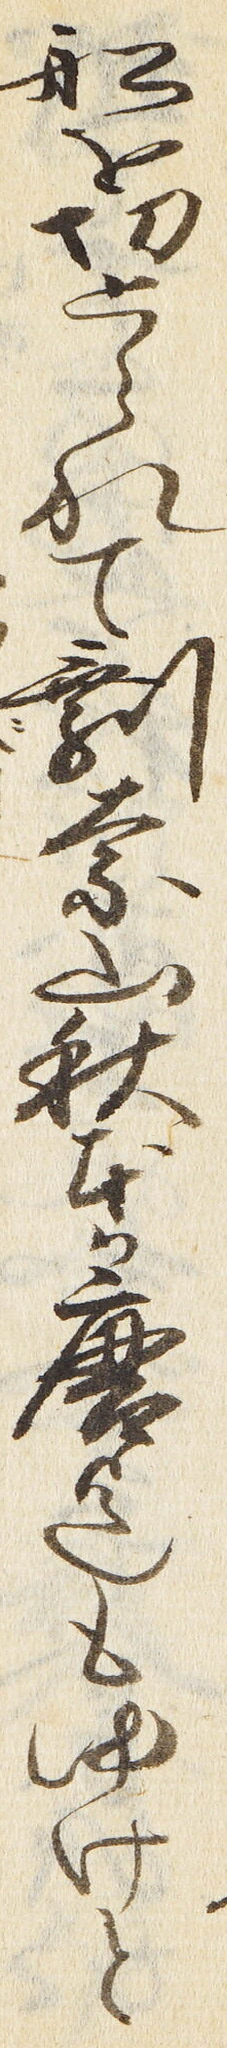船を切とられて剰奈山秋本か唐迄もゆけと
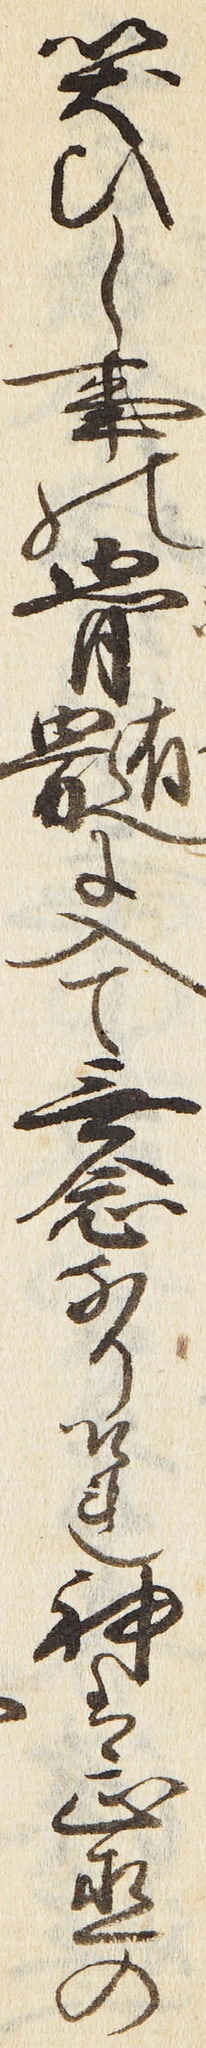笑ひし事の骨髄に入て無念なりそれ神は正直の
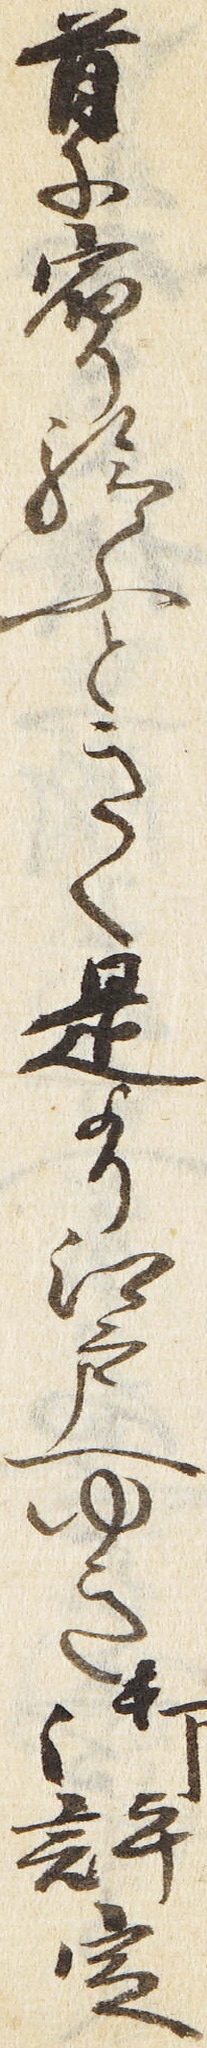首に宿り給ふときく是より江戸へゆき御評定
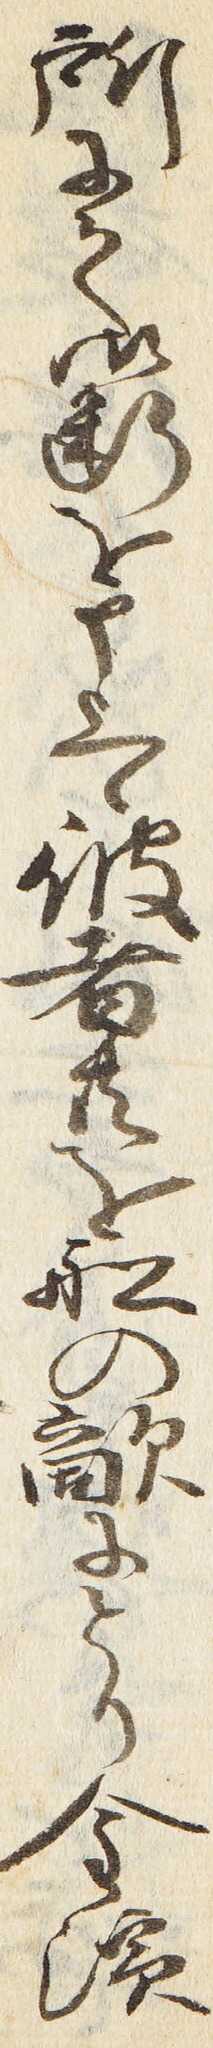所にて御断を申上候彼者共を船の敵にとり金浜
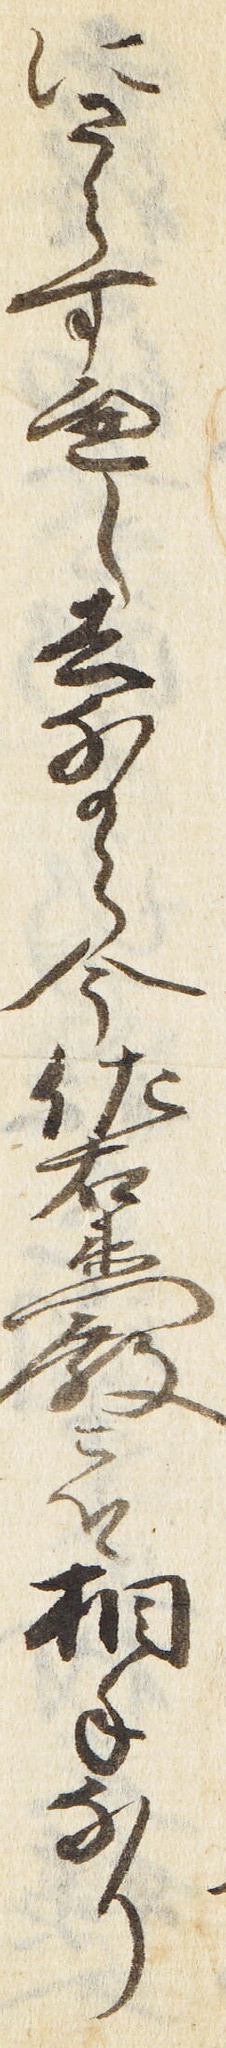にさらすへし去なから今佐右衛門殿こそ相手なり
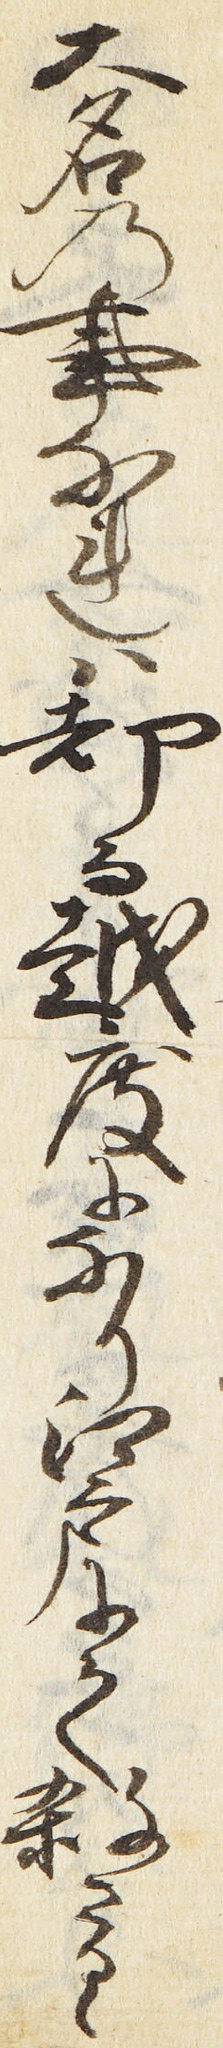大名の事なれは却而越度になり江戸にて殺さるゝ
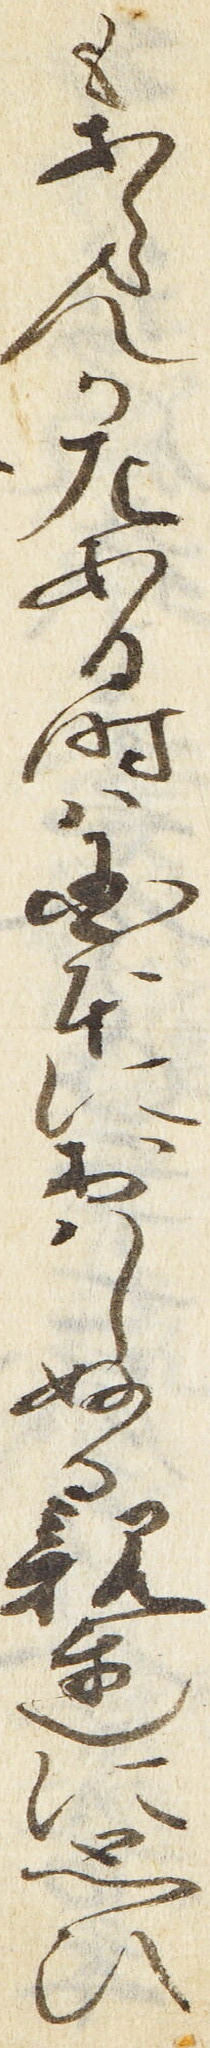もあらんか左ある時は国本におはしぬる親達に思ひ
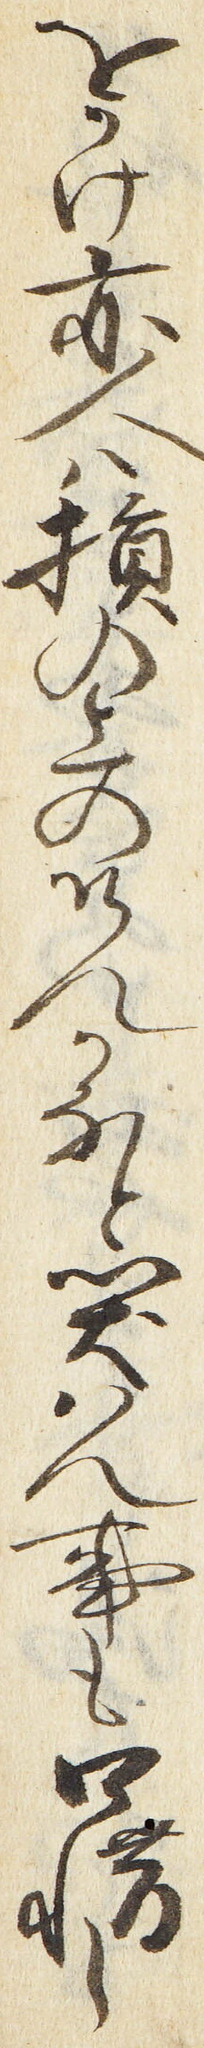をかけ亦人ハ損の上のけんかなと笑はん事も口惜し

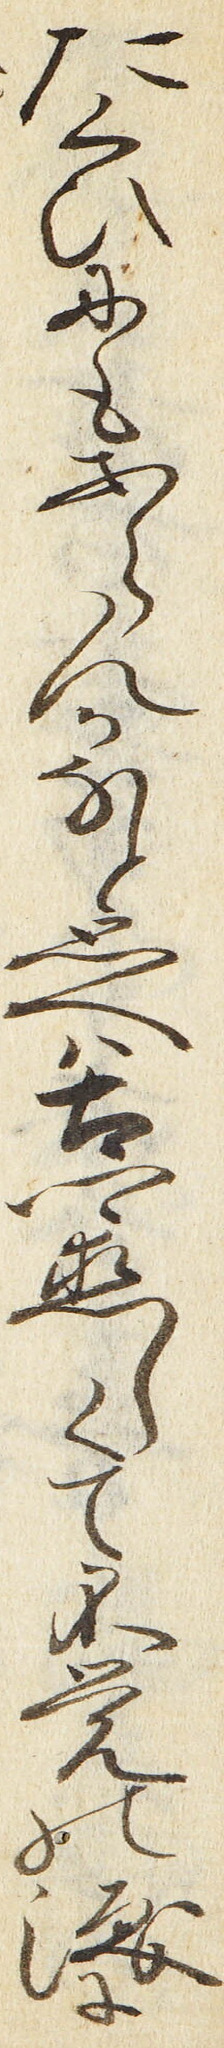たくひにもあらんかなと思へは古郷恋しくて不覚の涙に
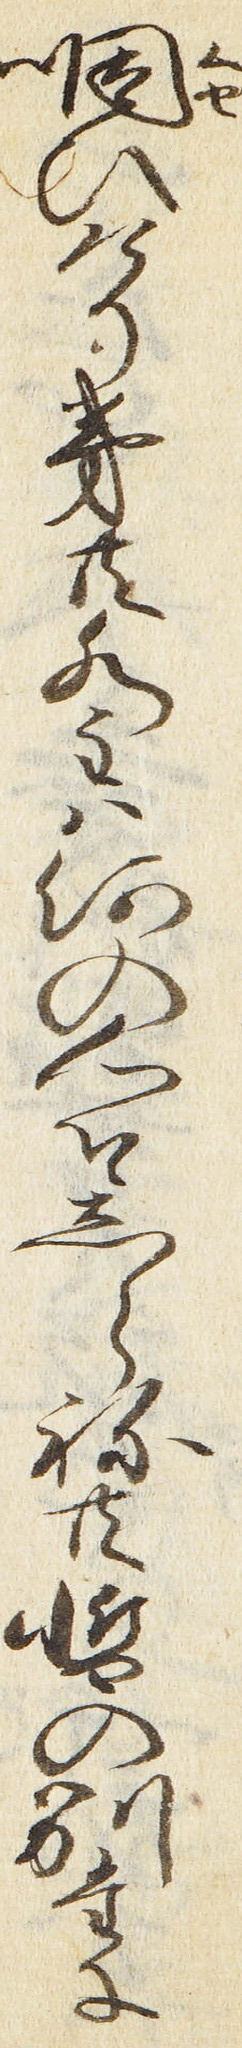咽ひけり弟共水主は何の心そしらね共暫の別たに
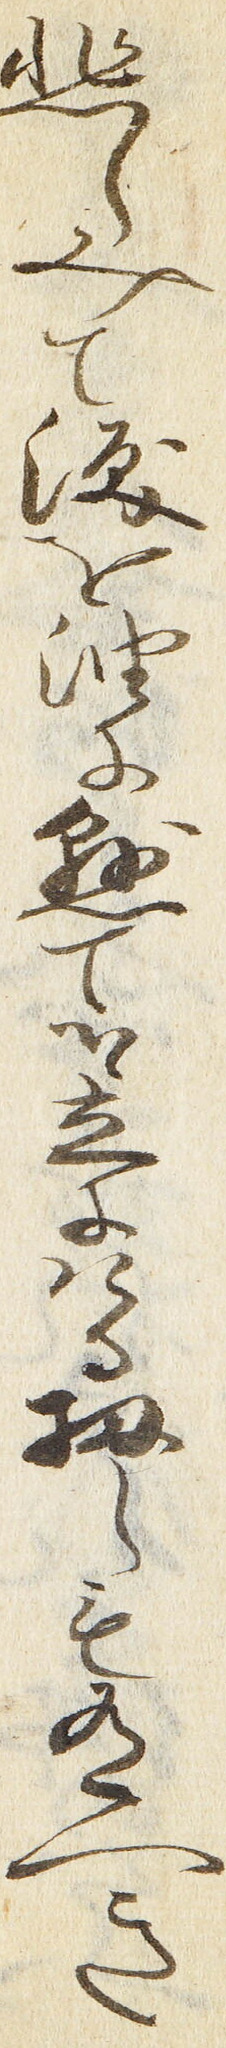悲しみて涙を袖に懸てそ立にける扨しも有へき
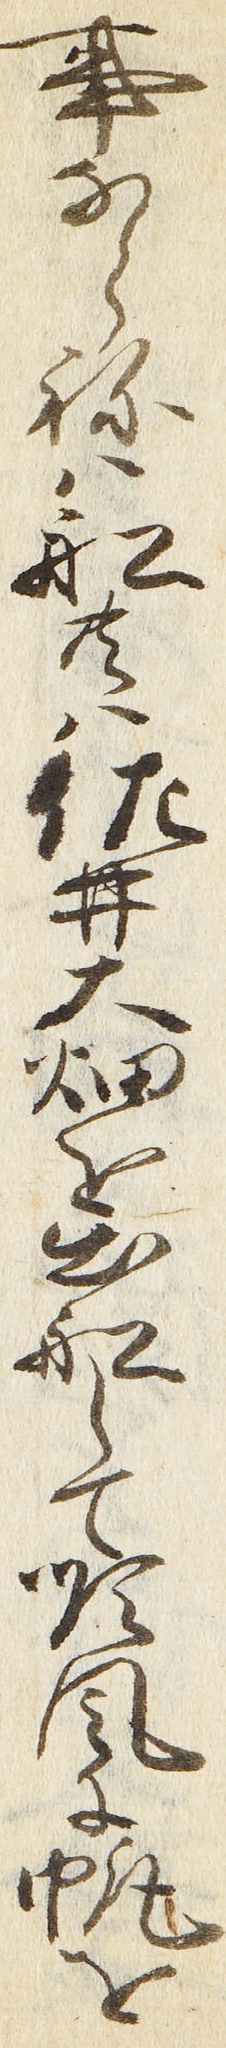事ならねは船共は佐井大畑を出船して順風に帆を
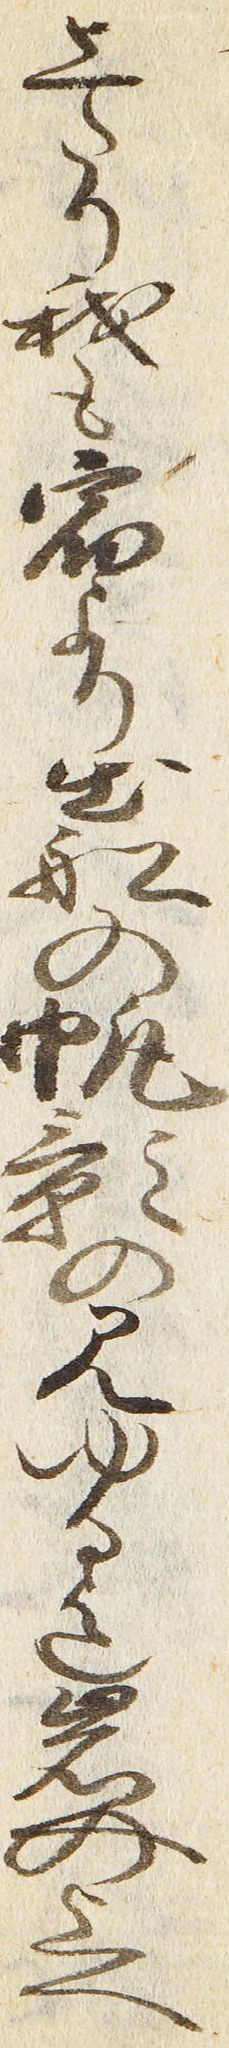上たり我も宿より出船の帆影の見ゆる迄岩の上へ
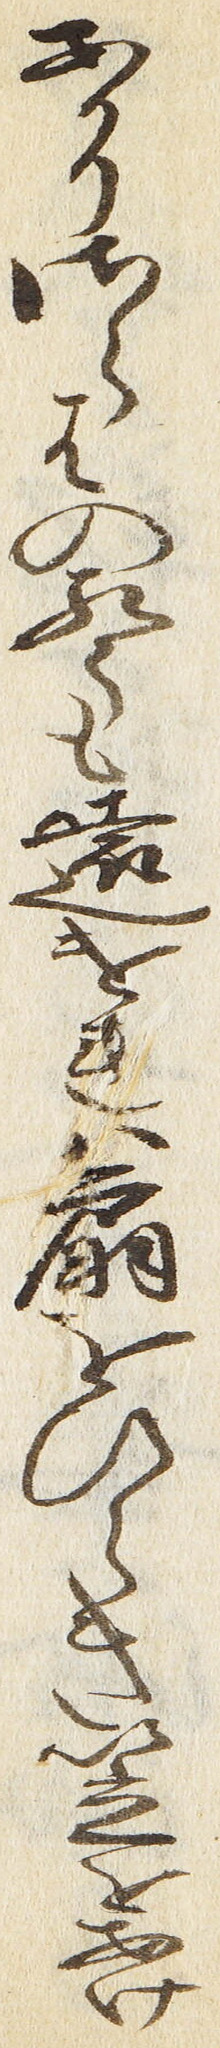あかりさらはの声も遠けれは扇をひらき笠をあけ
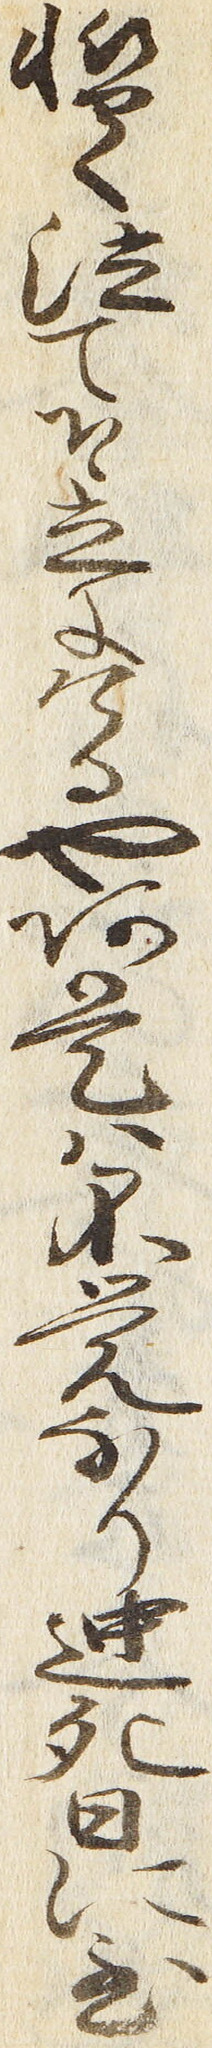暫く泣てそ立にけるやあ是は不覚なり迚死日に至
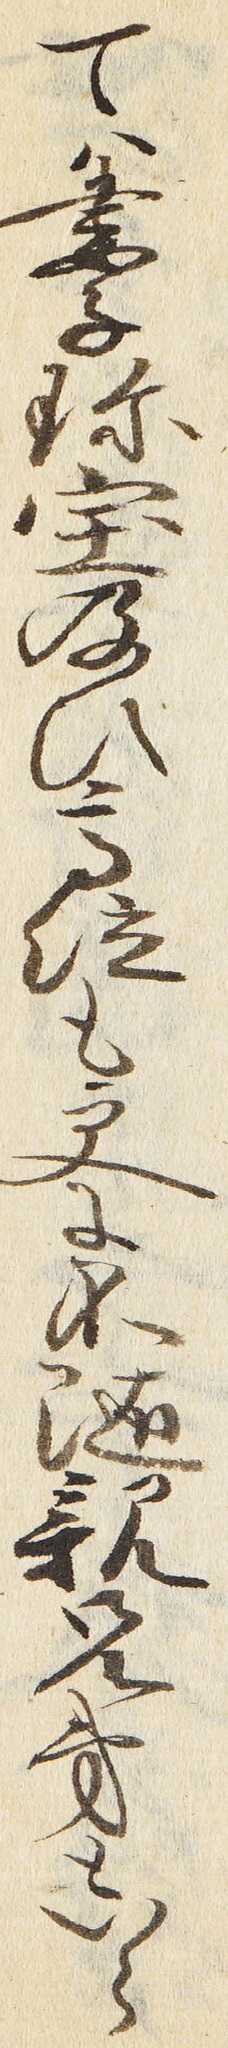ては妻子珍宝及ひ高位も更に不随親兄弟もいら
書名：海陸世話日記
